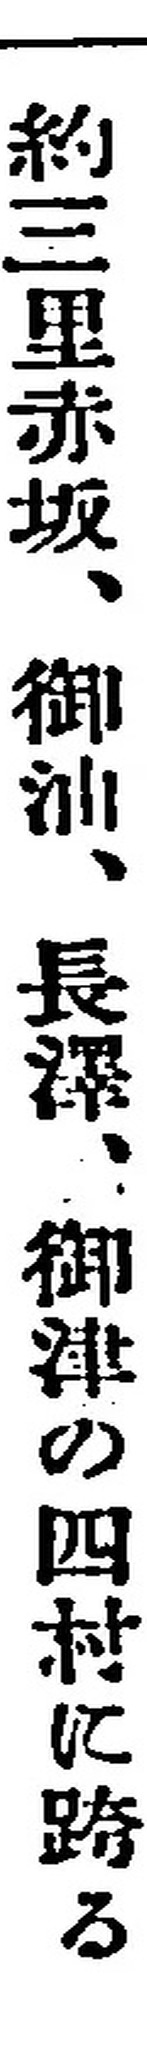約三里赤坂、御油、長沢、御津の四村に跨る
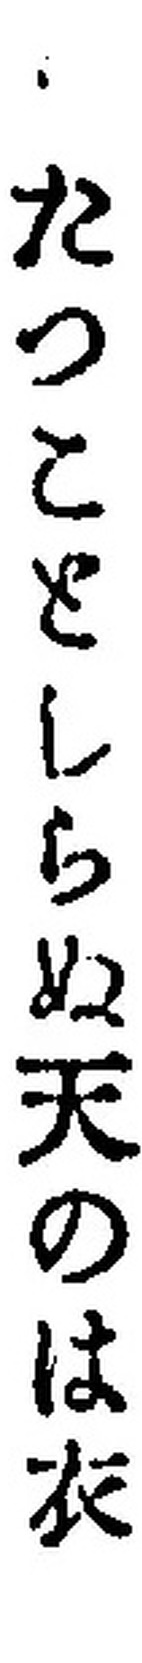たつことしらぬ天のは衣
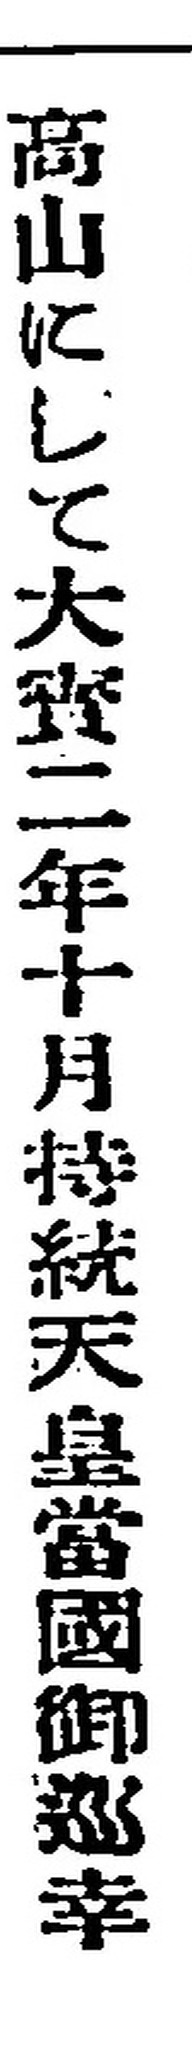高山にして大宝二年十月持統天皇当国御巡幸
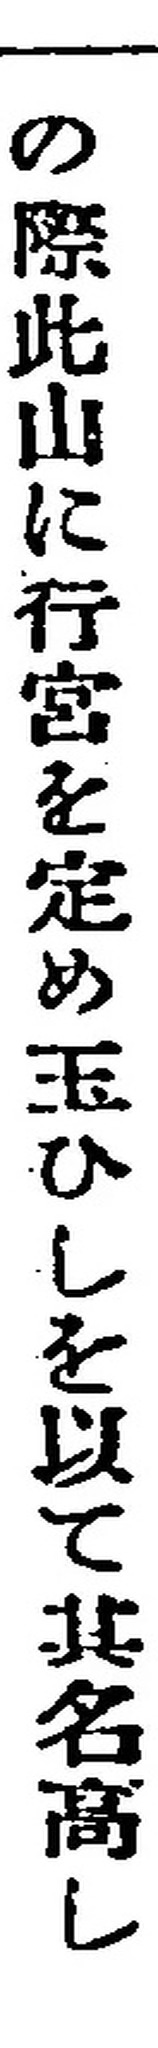の際此山に行宮を定め玉ひしを以て其名高し
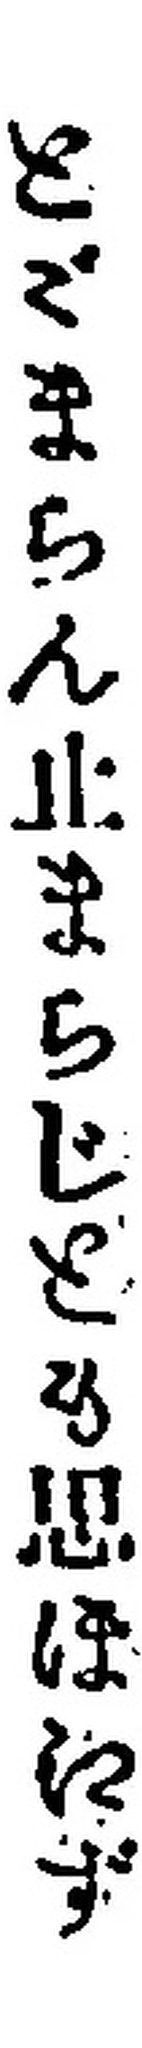とゞまらん止まらじとも思ほえず
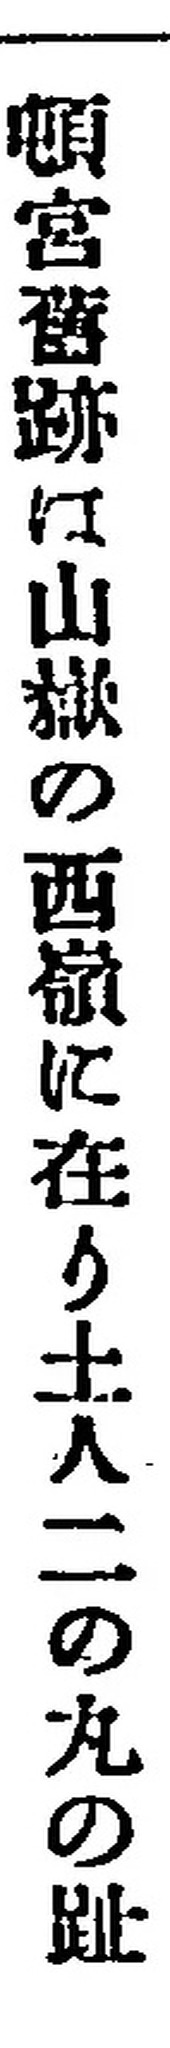頓宮旧跡は山嶽の西嶺に在り土人二の丸の趾
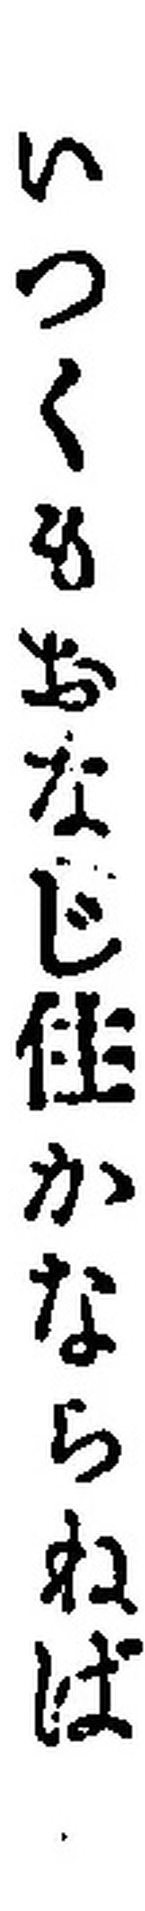いつくもおなじ住かならねば
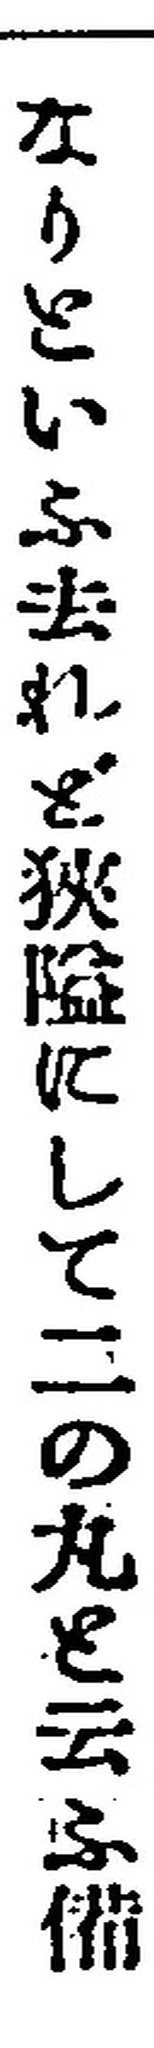なりといふ去れど狭隘にして二の丸と云ふ備
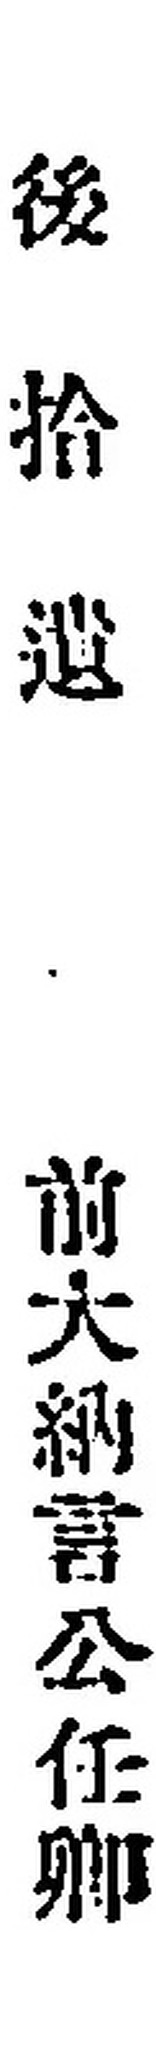後拾遺前大納公任卿
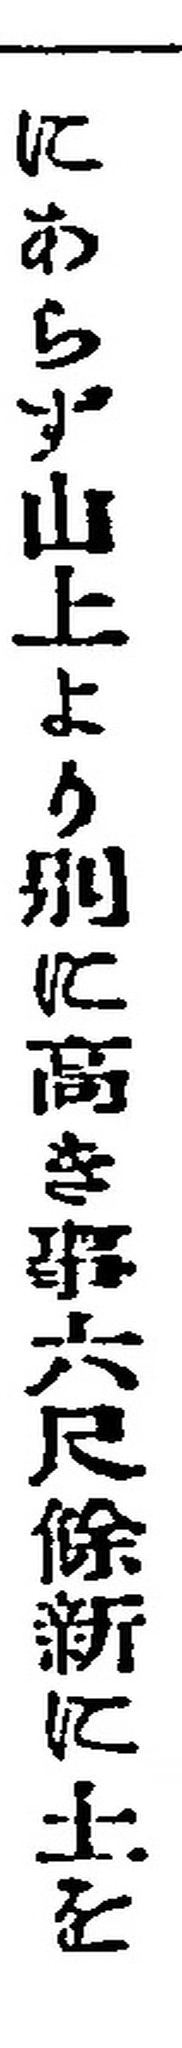にあらず山上より別に高き事六尺余新に土を
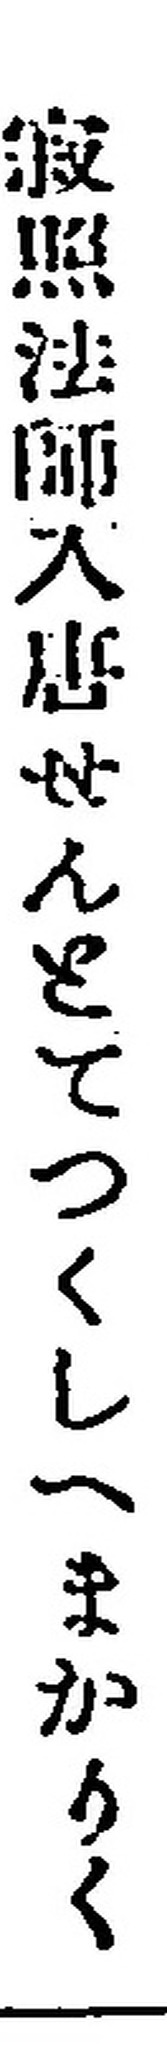寂照法師入唐せんとてつくしへまかりく
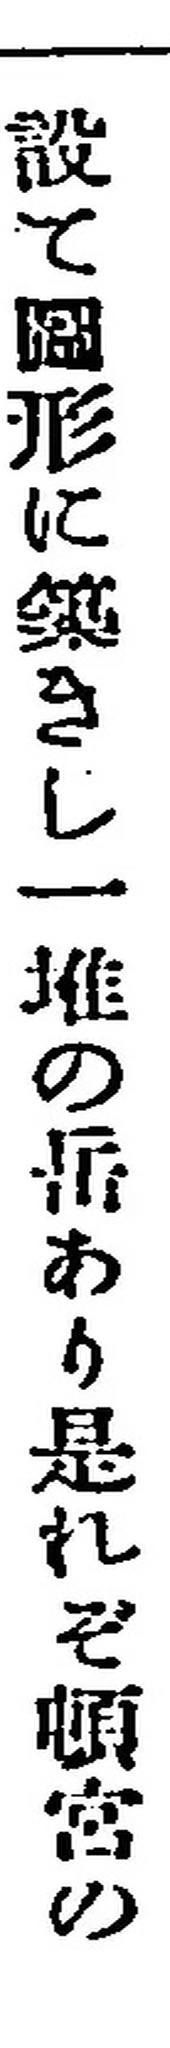設て図形に築きし一堆の岳あり是れぞ頓宮の
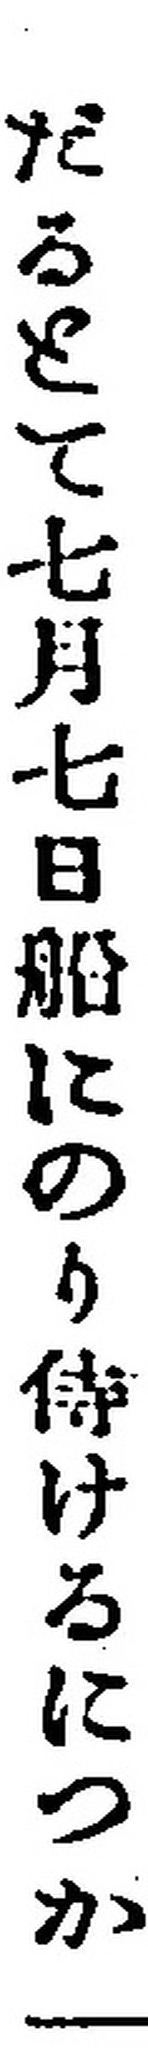だるとて七月七日船にのり侍けるにつか
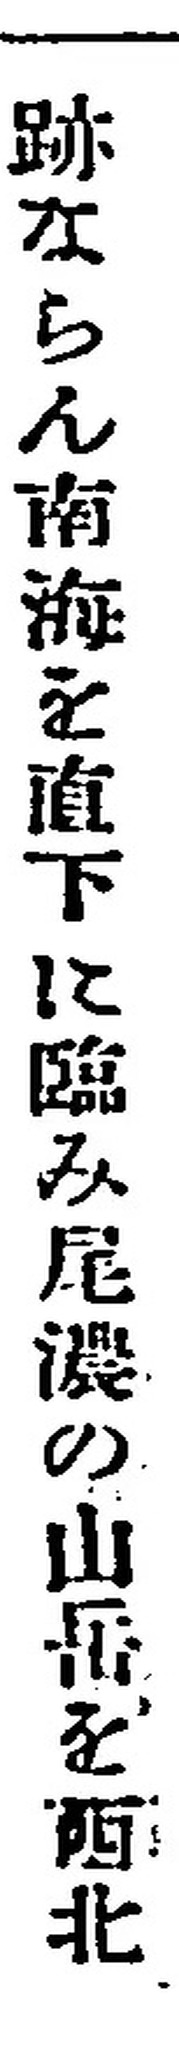跡ならん南海を直下に臨み尾濃の山岳を西北
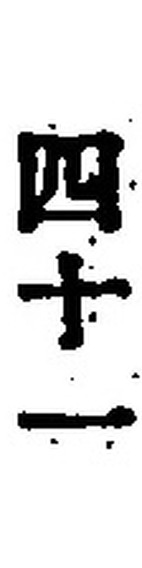四十一

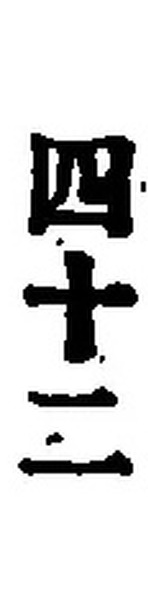四十二
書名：東参名勝案内
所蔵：国立国会図書館 National Diet Library, JAPAN
